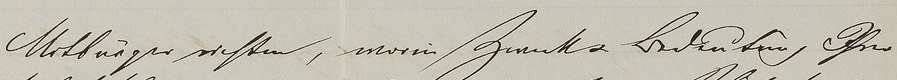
Mitbürger richten, worin Zweck & Bedeutung Ihrer
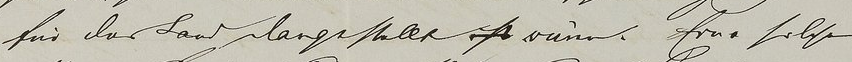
für das Land dargestellt ist wären. Eine solche
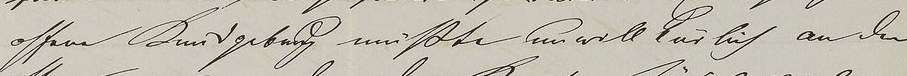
offene Kundgebung müßte unwillkürlich an den
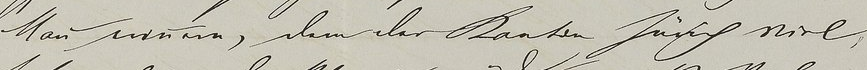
Mann erinnern, dem der Kanton Zürich viel,
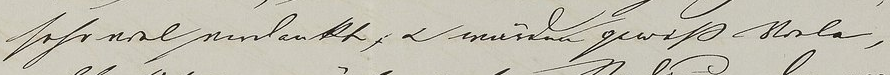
sehr viel verdankt, & würden gewiß Viele,
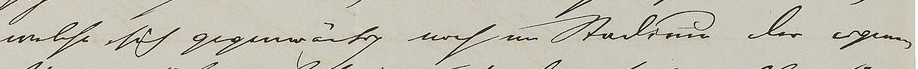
welche sich gegenwärtig noch im Stadium der eigenen
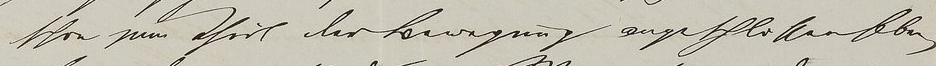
schon zum Theil der Bewegung angeschlossen haben,
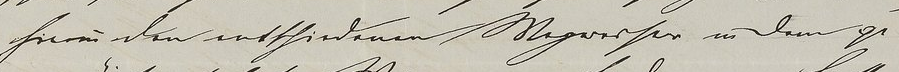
hierin den entschiedenen Wegweiser in dem ge-
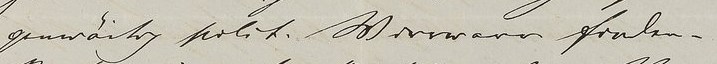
genwärtig polit. Wirrwarr finden.
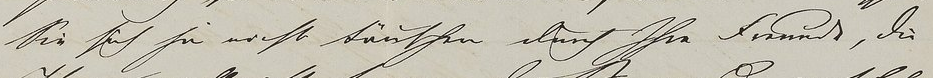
Sie sich ja nicht täuschen durch Ihre Freunde, die
